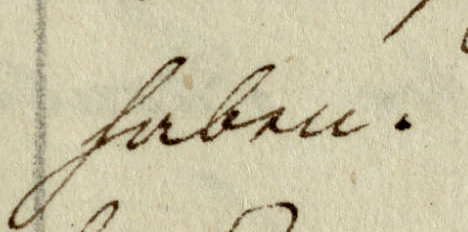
haben.
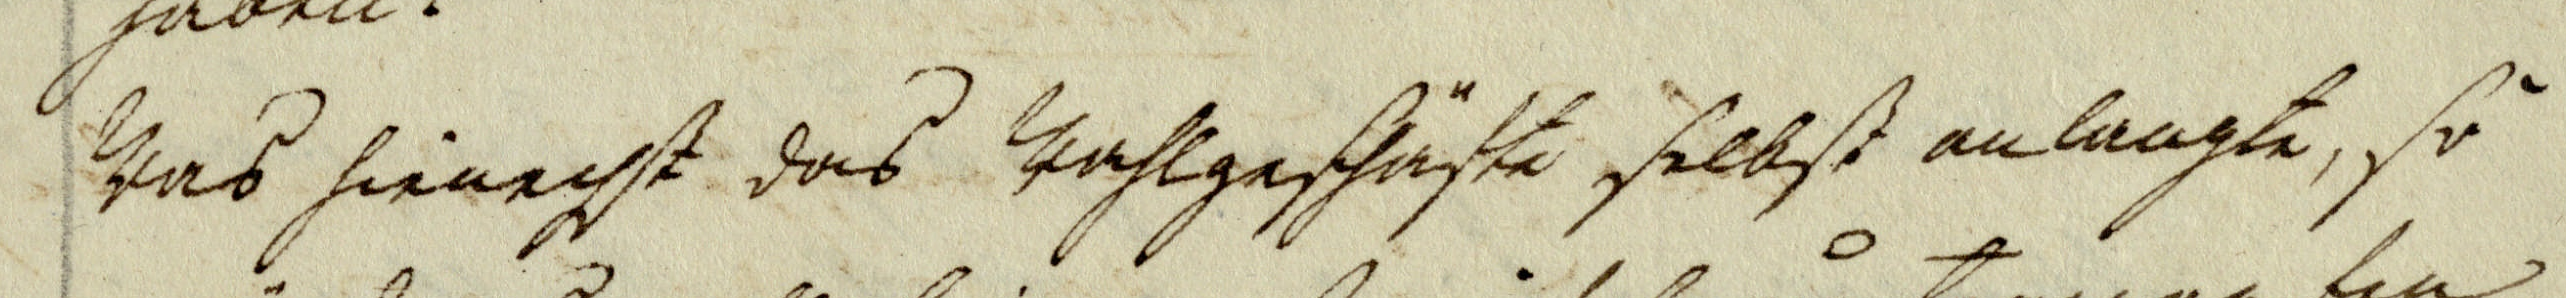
Was hienechst das Wahlgeschäfte selbst anlangte, so
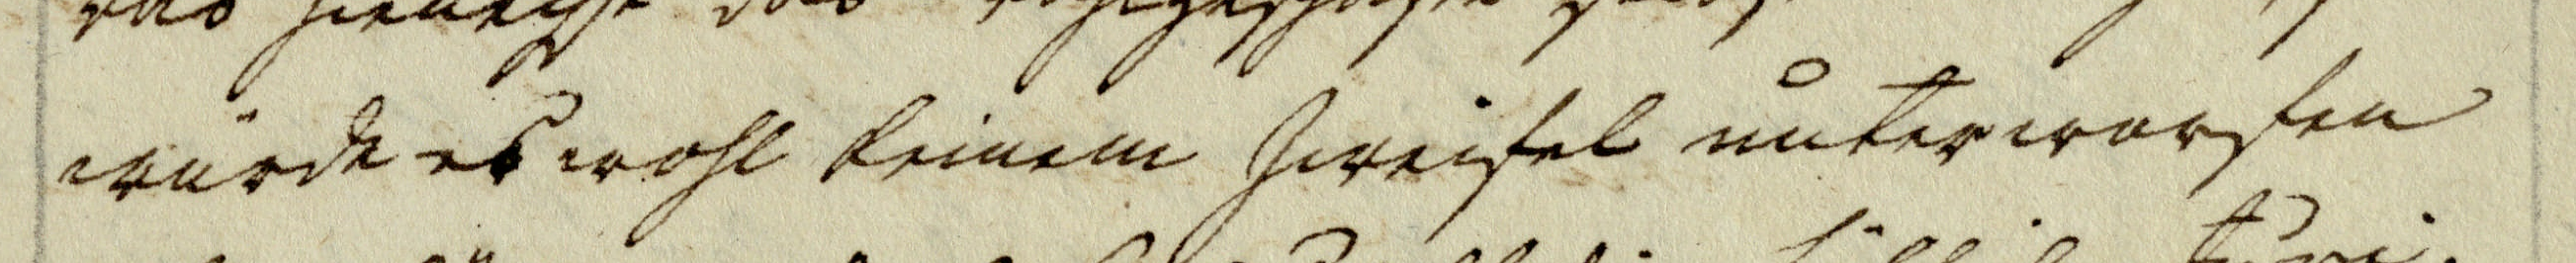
würde es wohl keinem Zweifel unterworfen
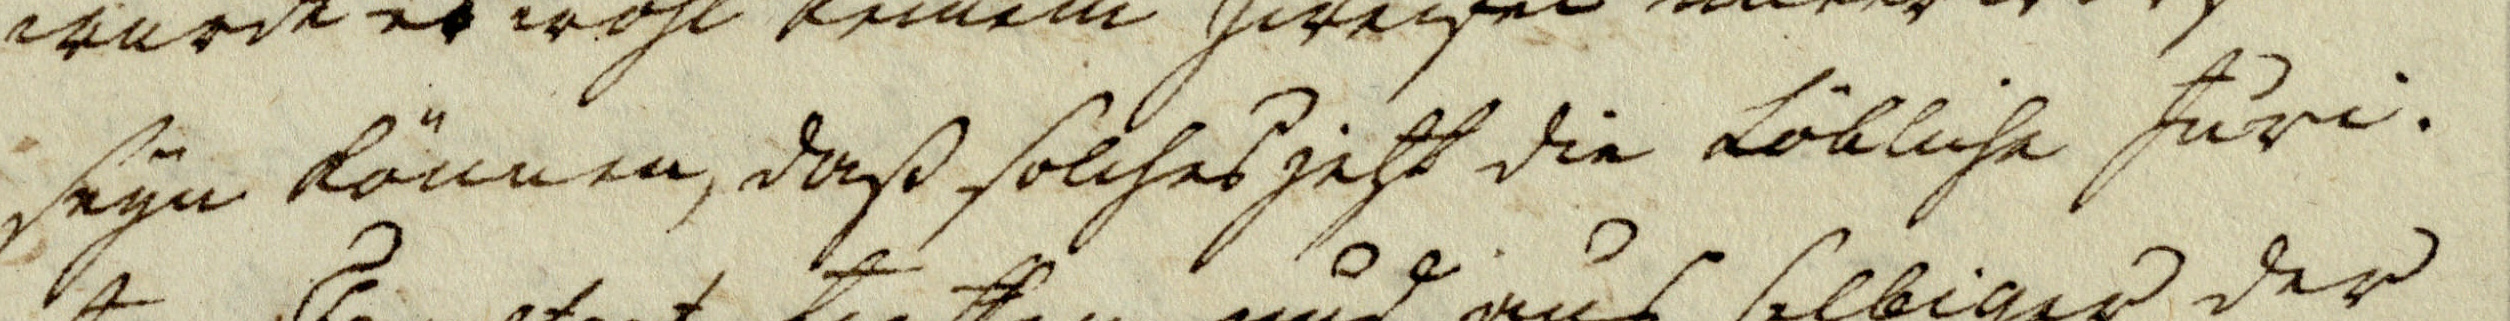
seÿn können, daß solches jetzt die Löbliche Juri¬
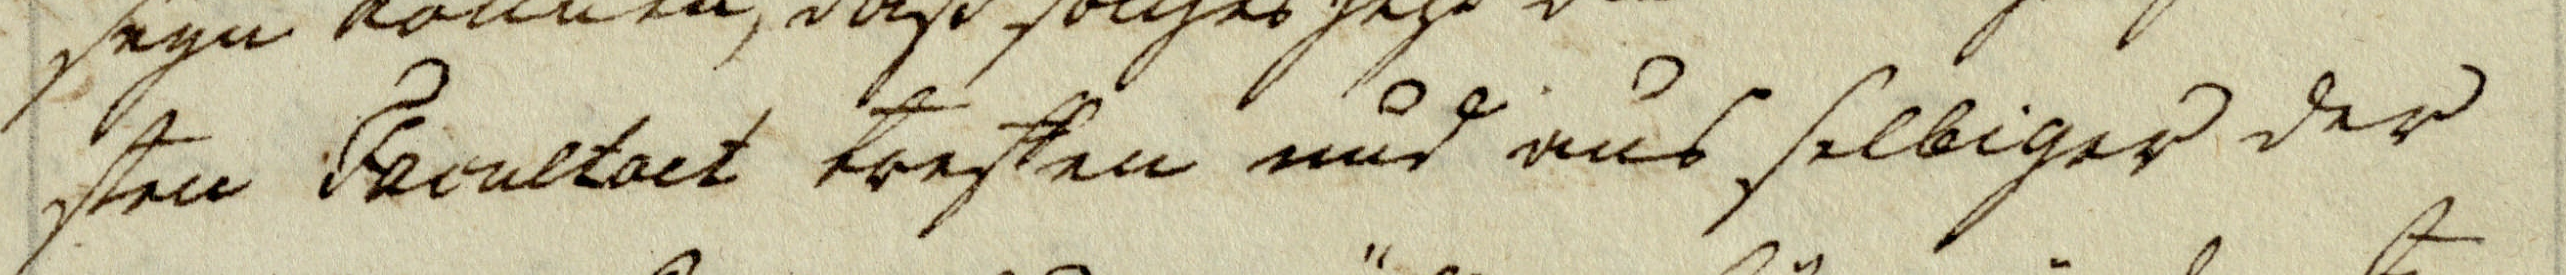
sten Facultaet treffen und aus selbiger der
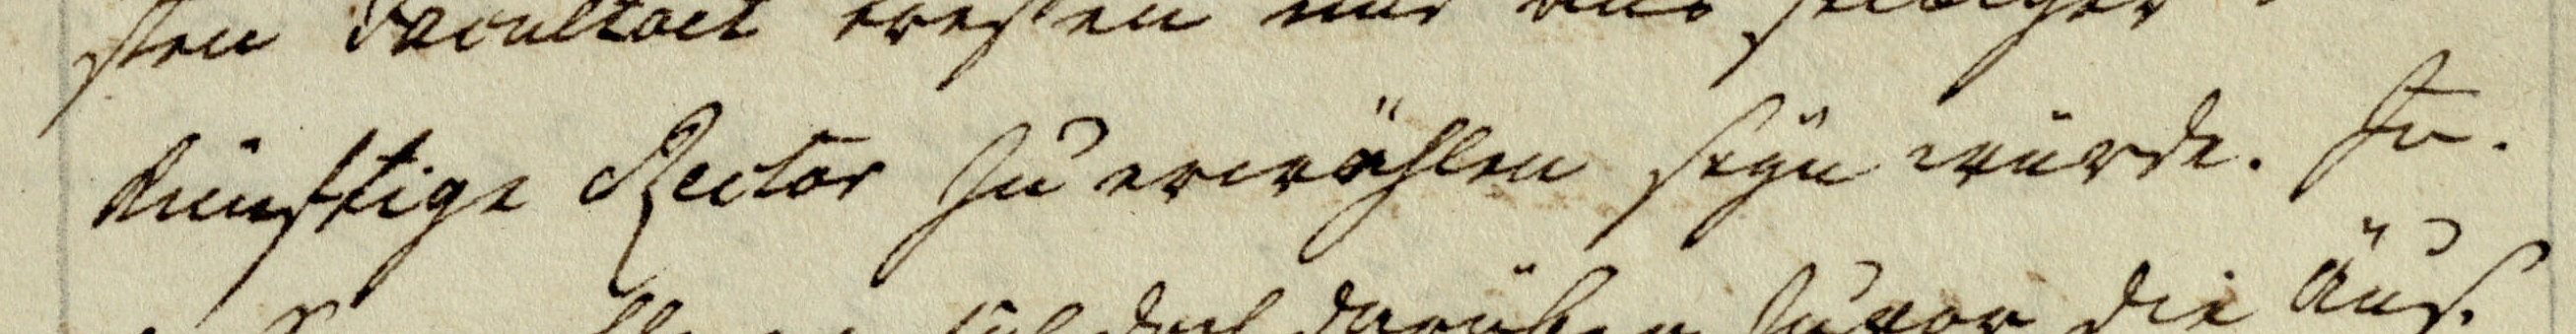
künftige Rector zu erwählen seÿn würde. In¬
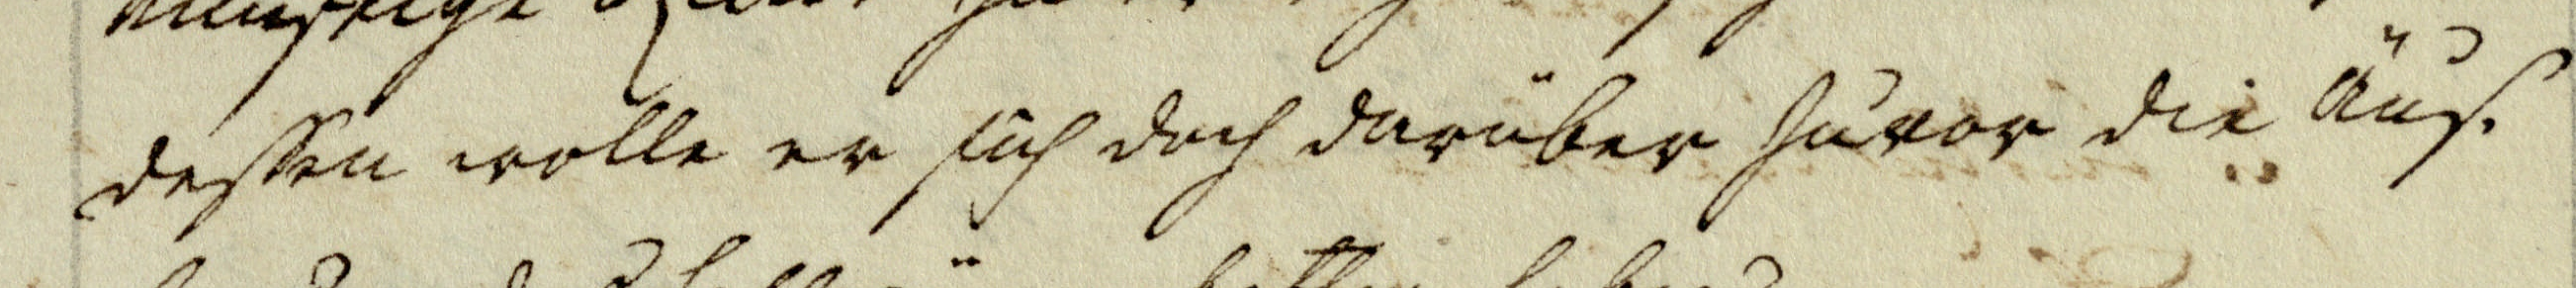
dessen wolle er sich doch darüber zuvor die Äus¬
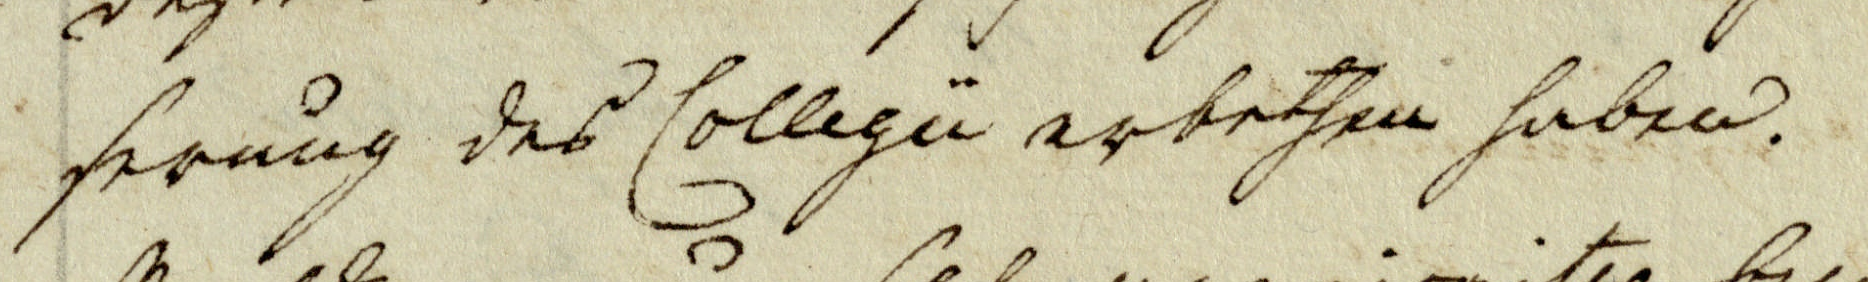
serung des Collegii erbethen haben.
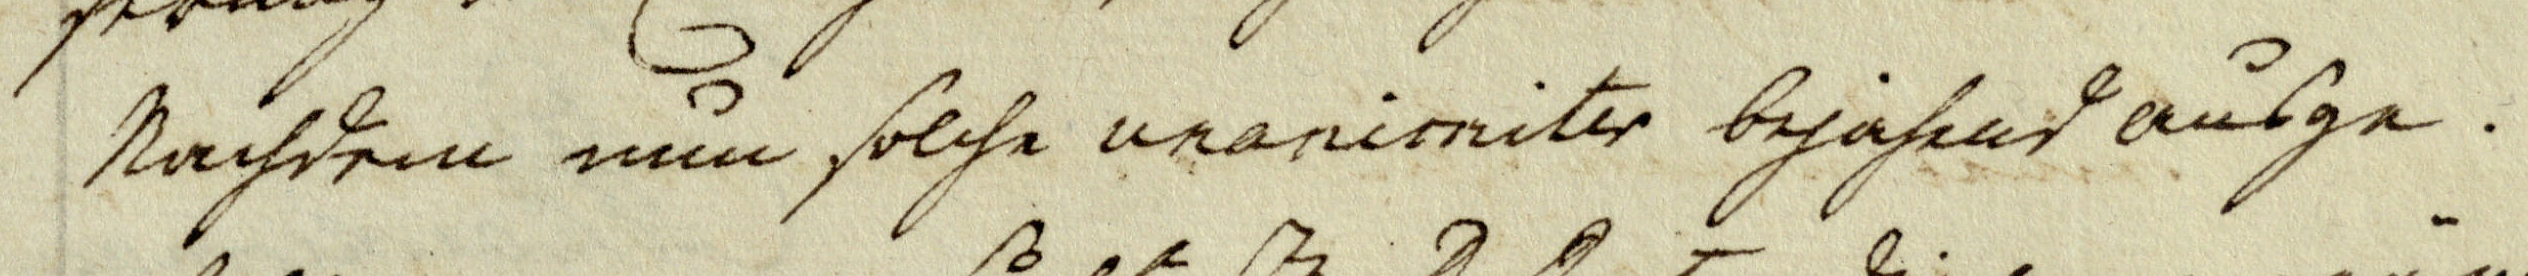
Nachdem nun solche unanimiter bejahend ausge¬
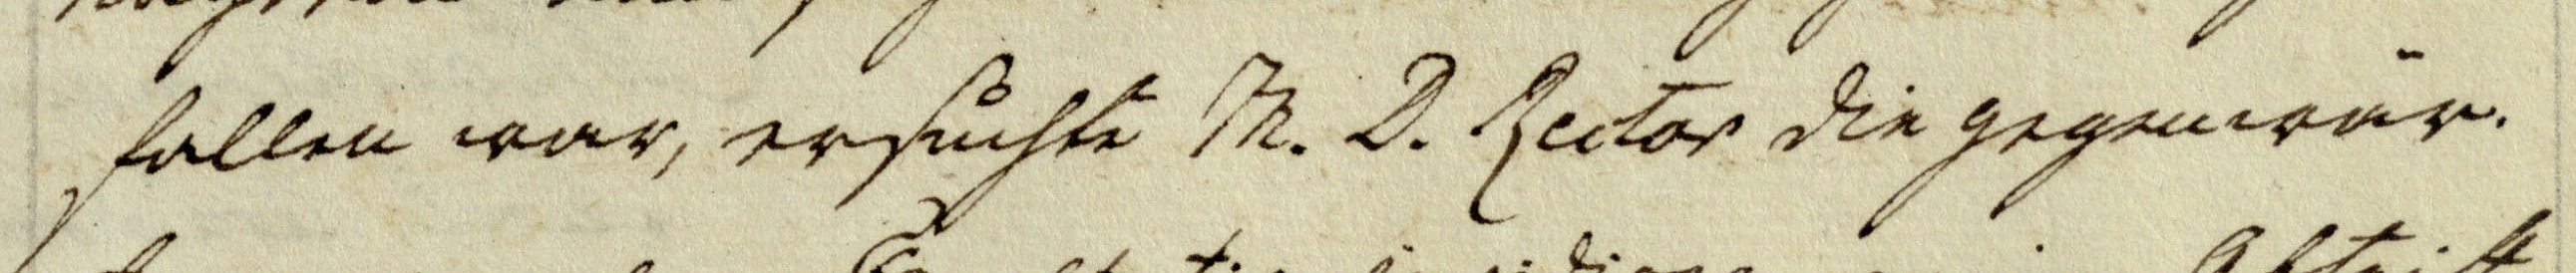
fallen war, ersuchte M. D. Rector die gegenwär¬
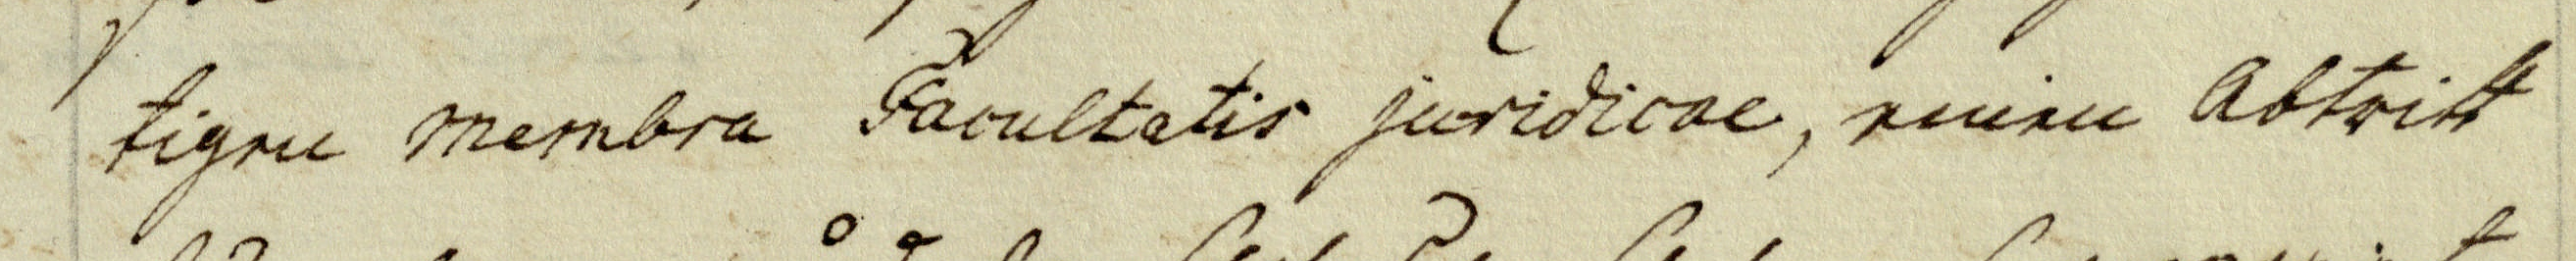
tigen membra Facultatis juridicae, einen Abtritt
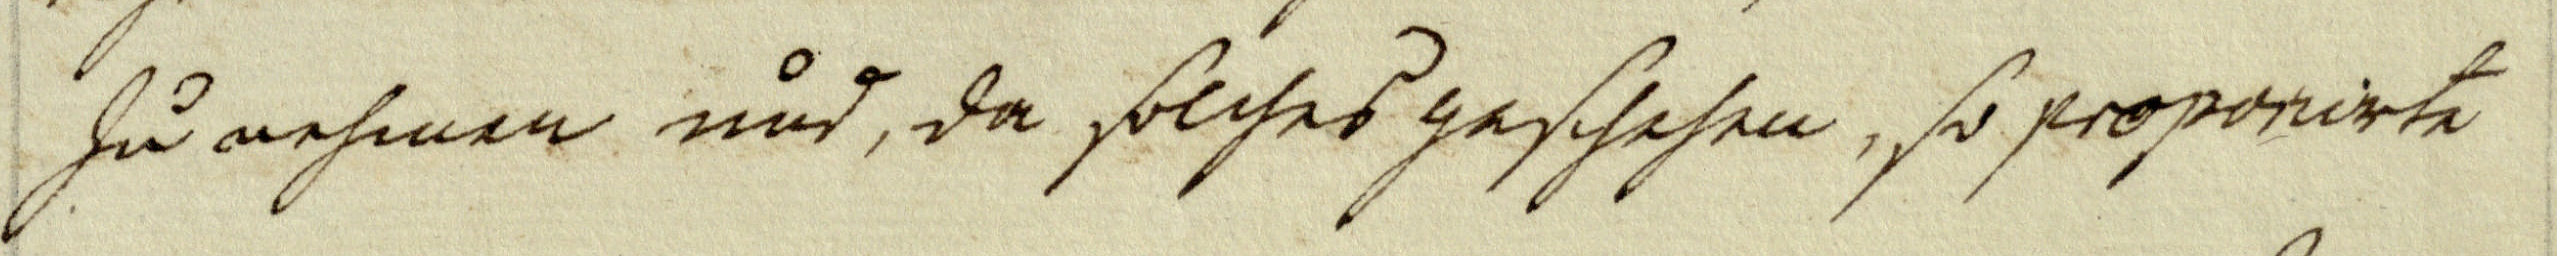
zu nehmen und, da solches geschehen, so proponirte
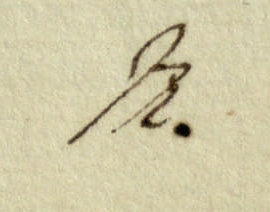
N
